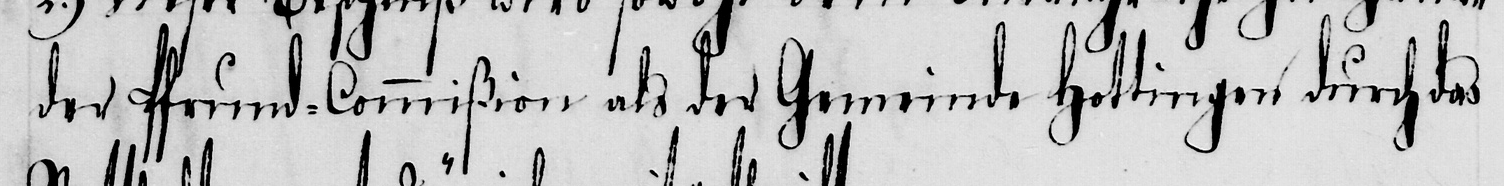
der Pfrund-Commißion als der Gemeinde Hottingen durch das
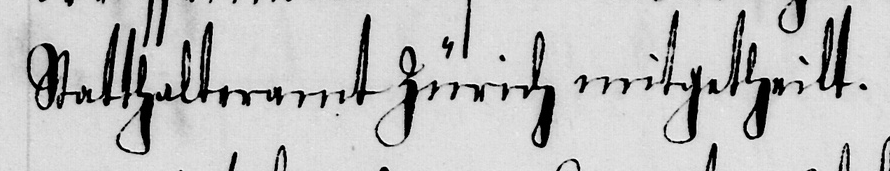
Statthalteramt Zürich mitgetheilt.
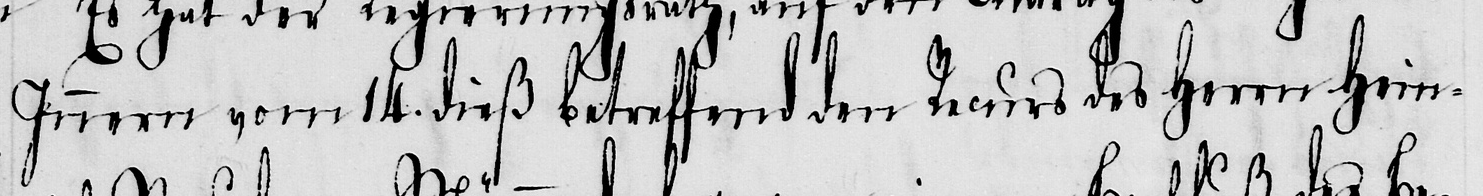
Innern vom 14. dieß betreffend den Recurs des Herrn Hein¬
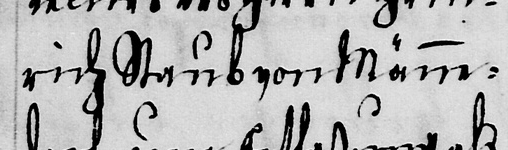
rich Staub von Männe¬
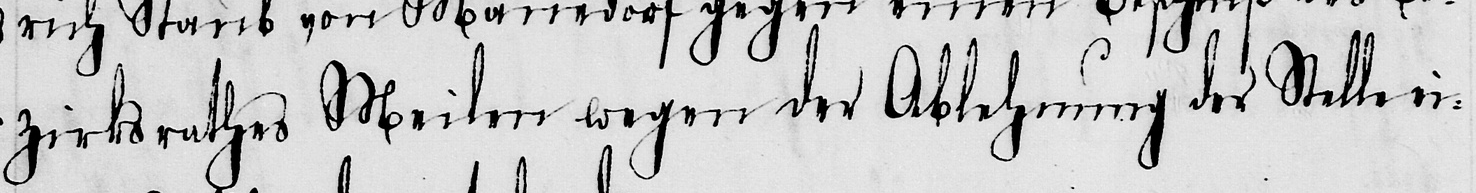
zirksrathes Meilen wegen der Ablehnung der Stelle e¬
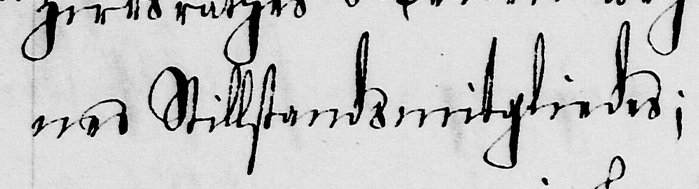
ines Stillstandsmitgliedes;
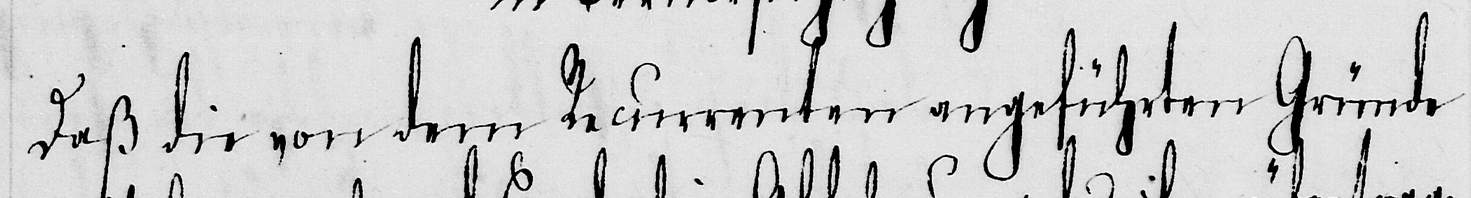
Daß die von dem Recurrenten angeführten Gründe
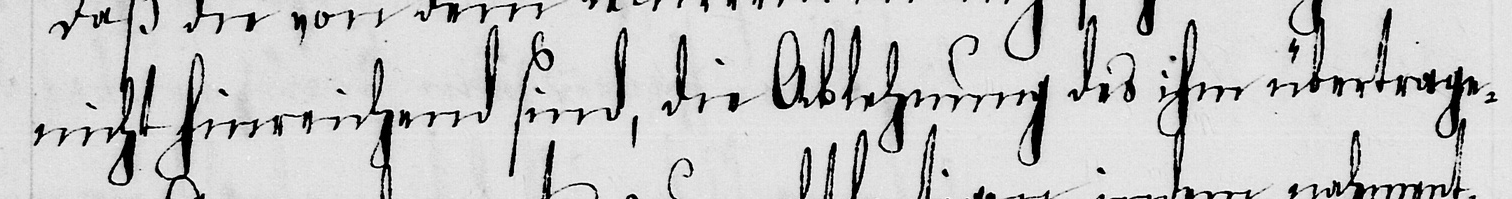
nicht hinreichend sind, die Ablehnung des ihm übertrage¬
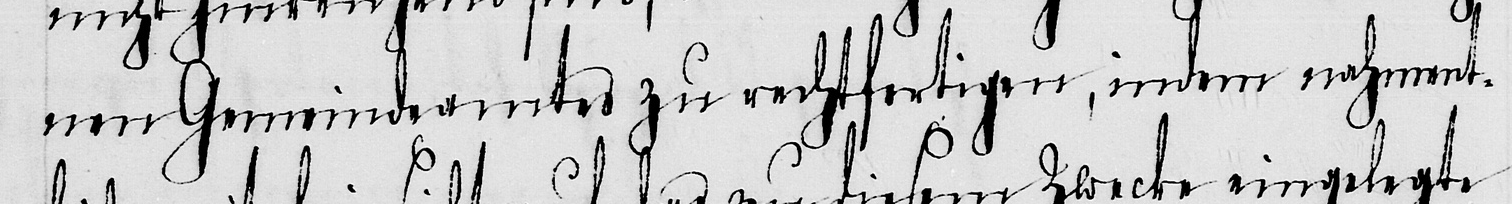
nen Gemeindeamtes zu rechtfertigen, indem nahment¬
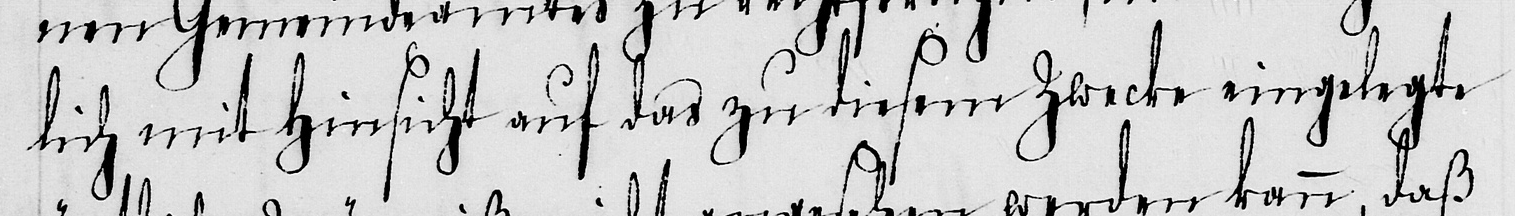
lich mit Hinsicht auf das zu diesem Zwecke eingelegte
